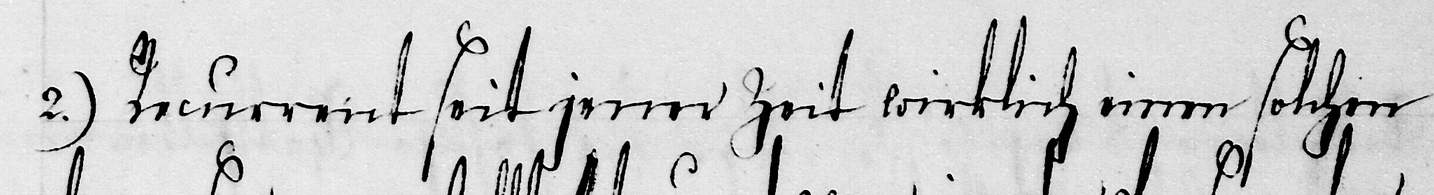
2.) Recurrent seit jener Zeit wirklich einen solchen
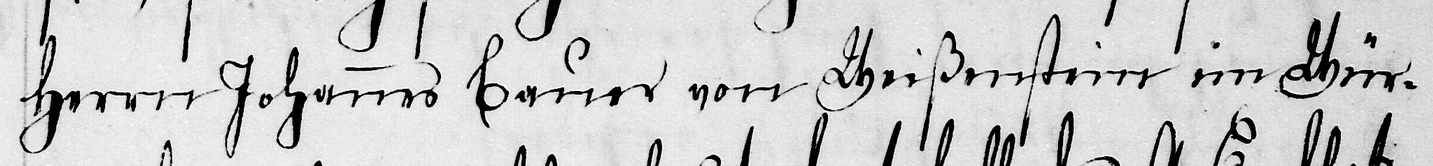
Herrn Johannes Bauer von Weißenstein im Wür¬
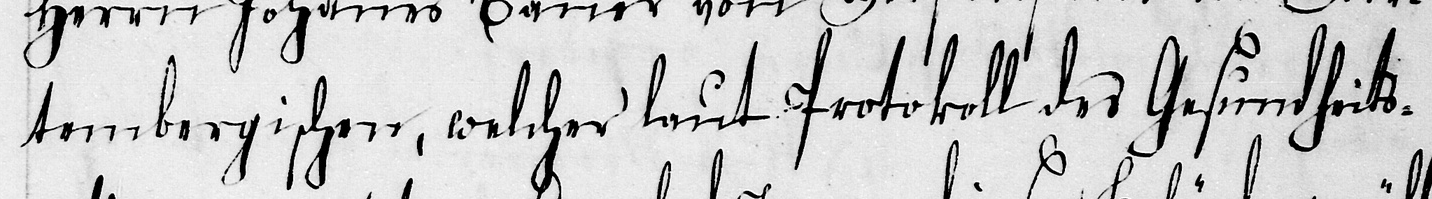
tembergischen, welcher laut Protokoll des Gesundheits¬
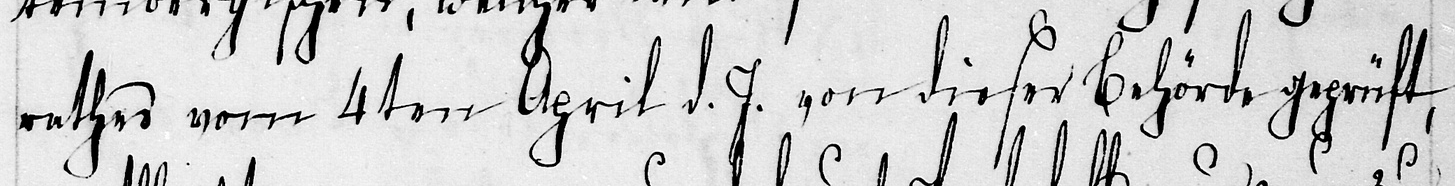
rathes vom 4ten April d. J. von dieser Behörde geprüft,
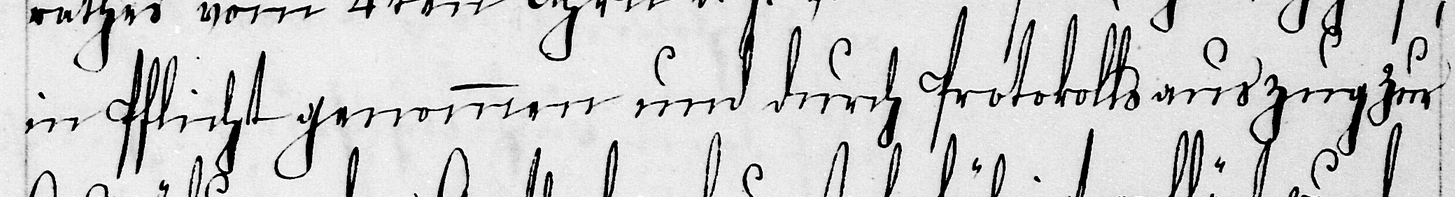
in Pflicht genommen und durch Protokollsauszug zur
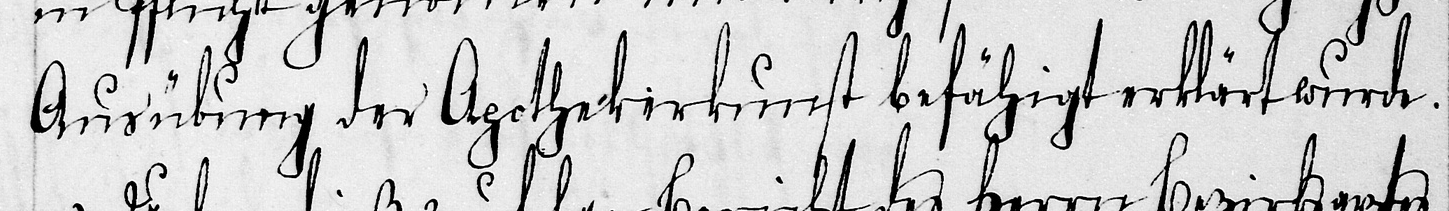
Ausübung der Apothekerkunst befähigt erklärt wurde.
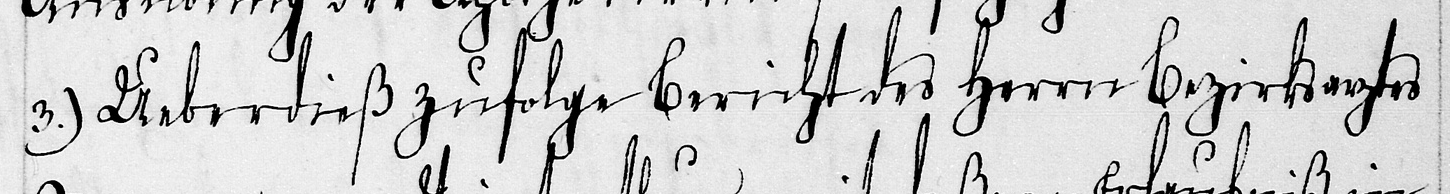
3.) Ueberdieß zufolge Bericht des Herrn Bezirksarztes
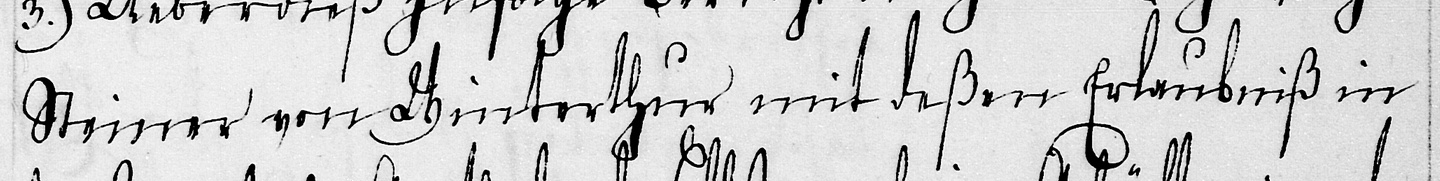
Steiner von Winterthur mit deßen Erlaubniß in
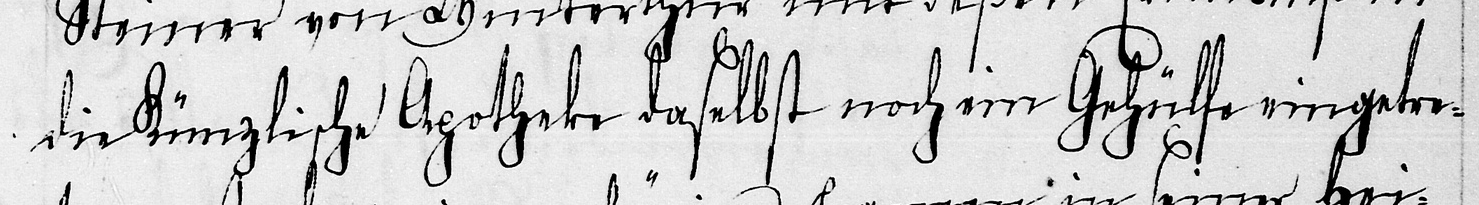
die Künzlische Apotheke daselbst noch ein Gehülfe eingetre¬
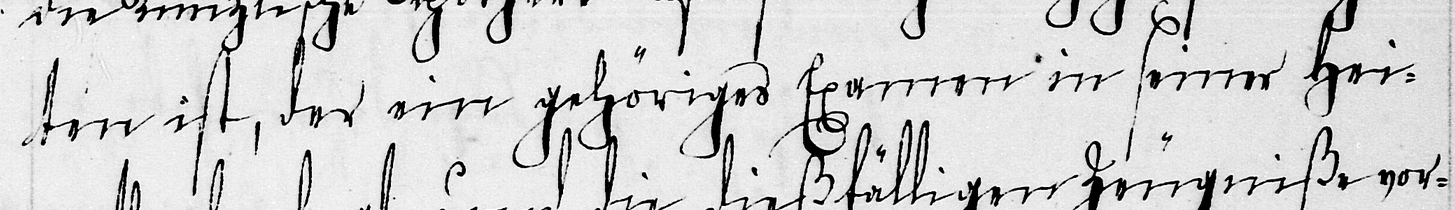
ten ist, der ein gehöriges Examen in seiner Hei¬
